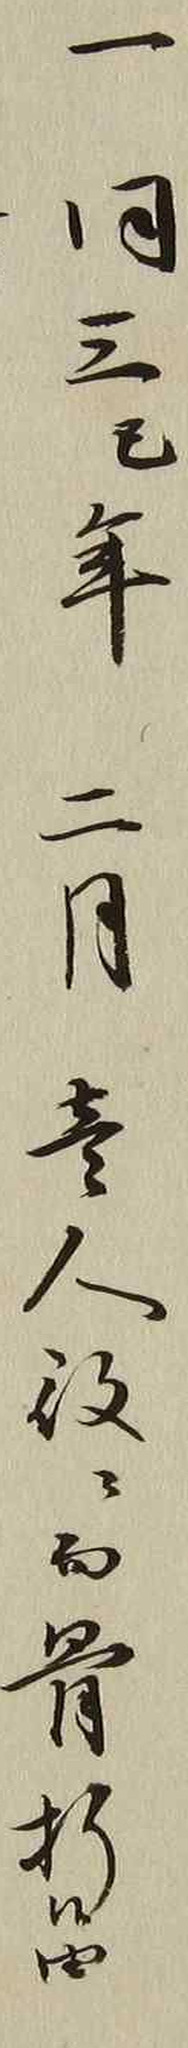一同三巳年二月壱人役ニて骨折り候由
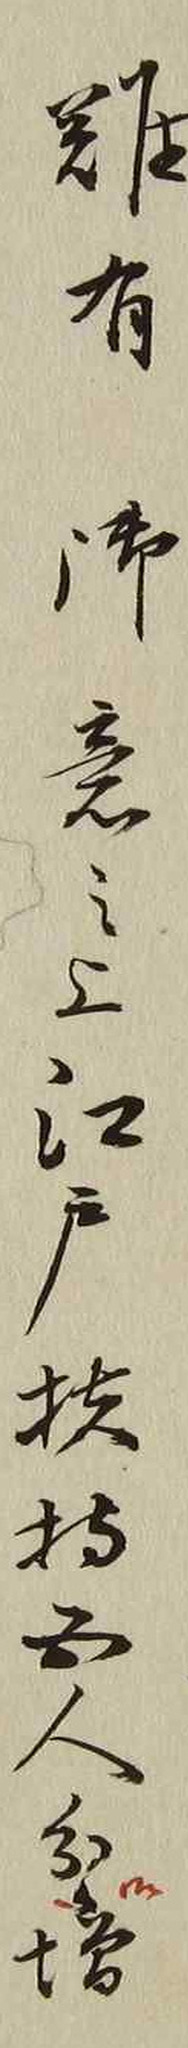有難御意之上江戸扶持五人分御増
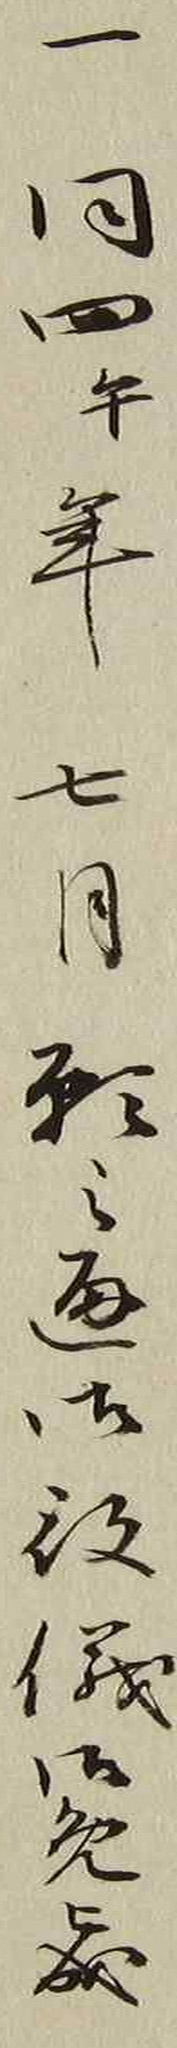一同四午年七月願い之通り御役儀御免成られ
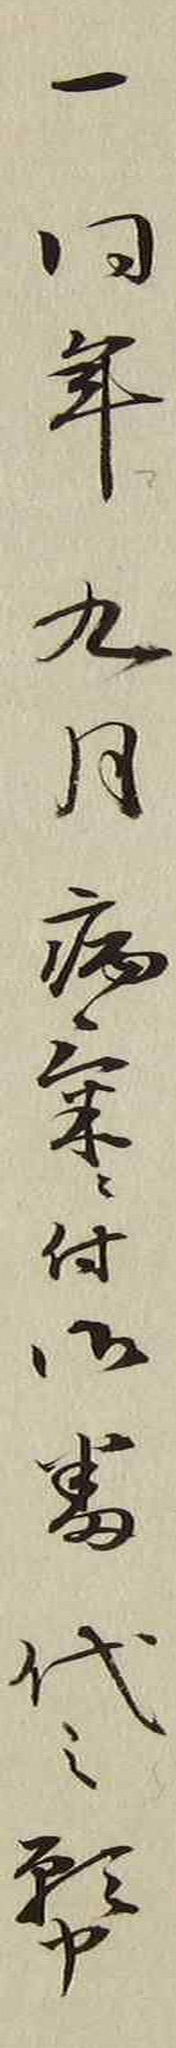一同年九月病気ニ付き御番代之願申
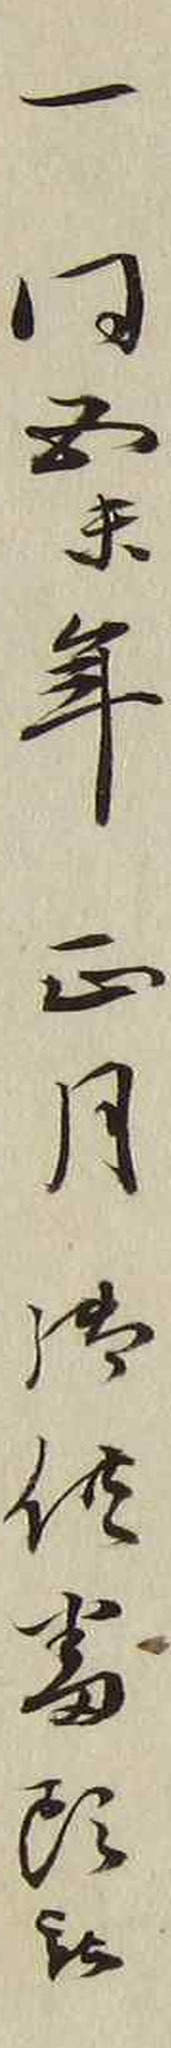一同五未年正月御供番頭

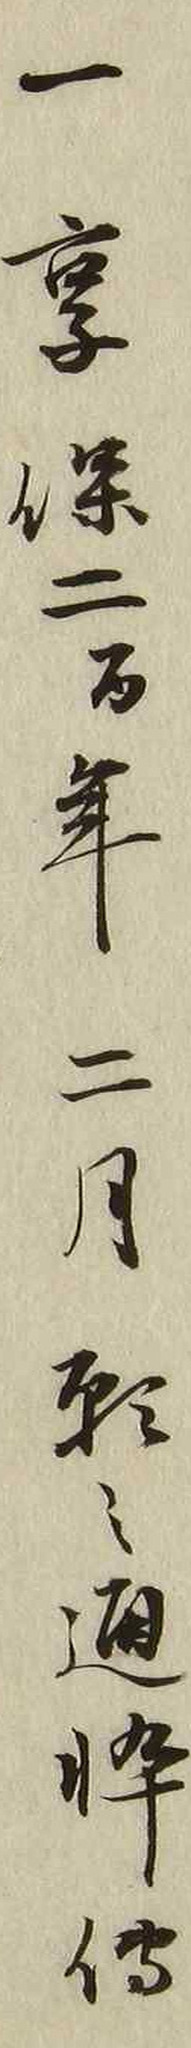一享保二酉年二月願い之通り倅傳
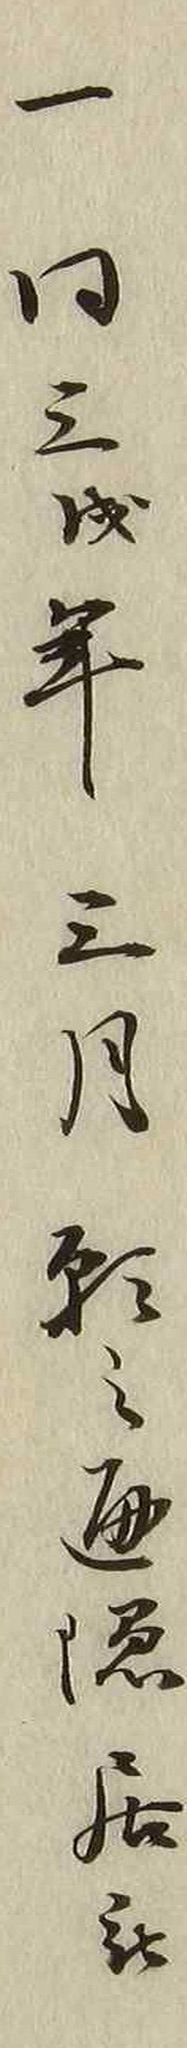一同三戌年三月願い之通り隠居
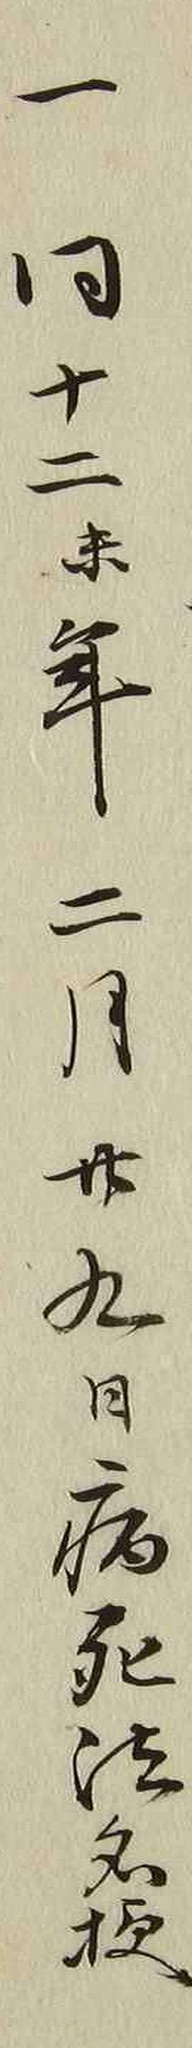一同十二未年二月廿九日病死法名授
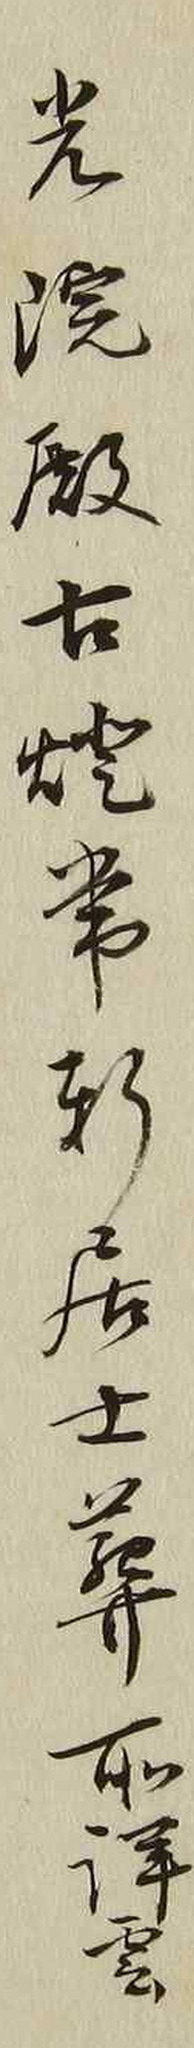光院殿古燈常新居士葬所詳雲
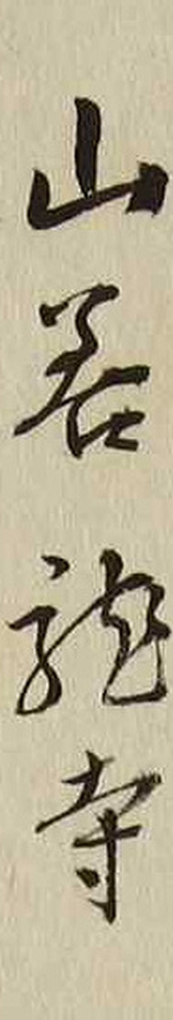山善龍寺
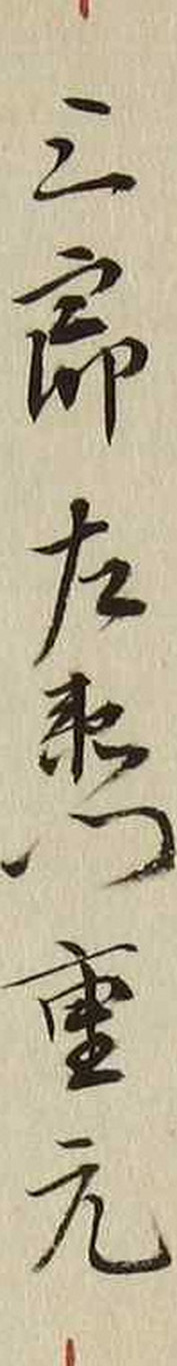三郎左衛門重元
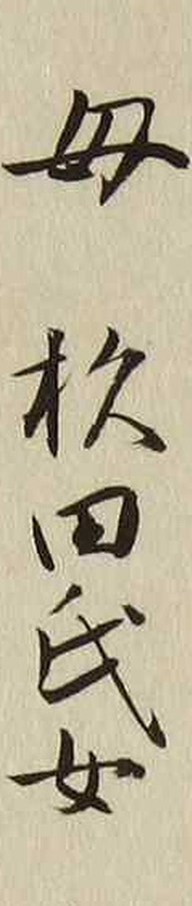母杉田氏女
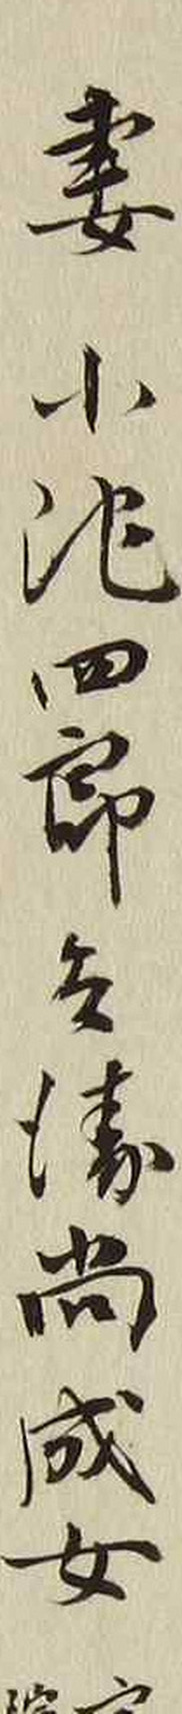妻小池四郎兵衛尚成女
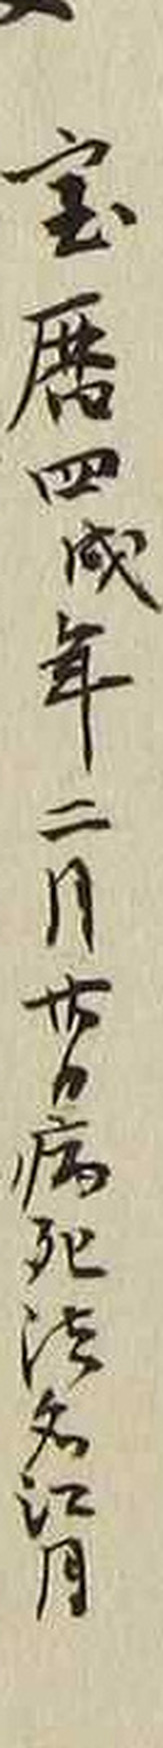宝暦四戌年二月廿日病死法名
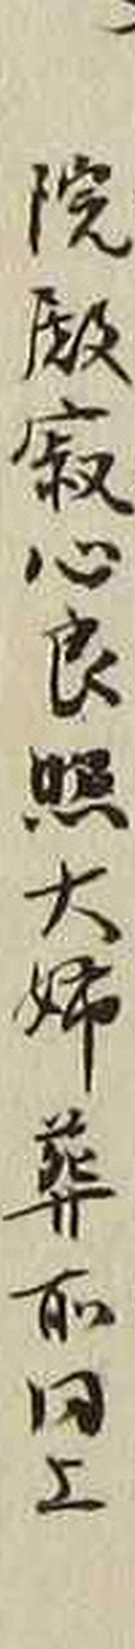江月殿寂心良照大姉葬所同上
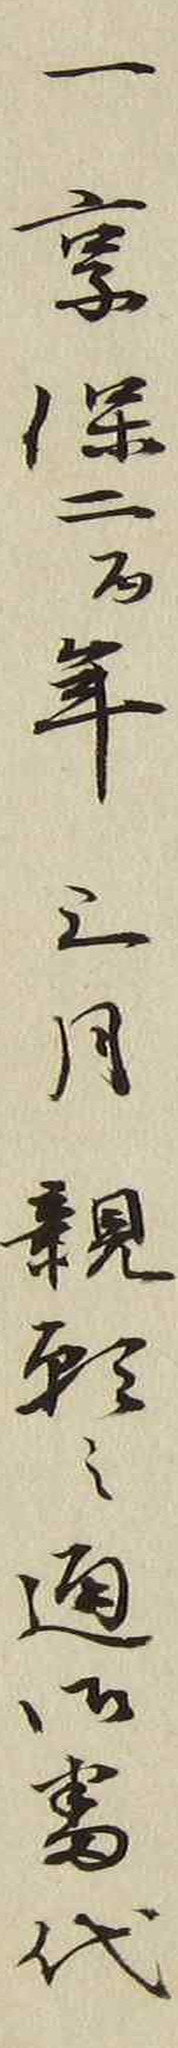一享保二酉年三月親願い之通御番代
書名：諸士系譜　巻之16　い之部16
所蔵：会津若松市立会津図書館
